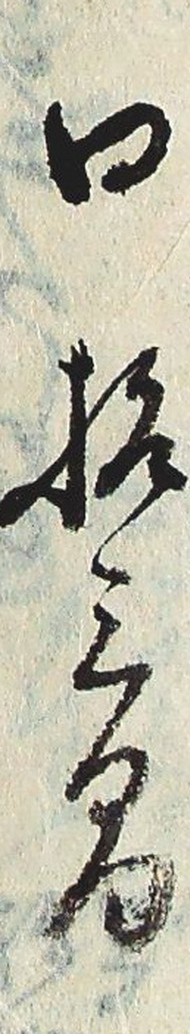同拾八間
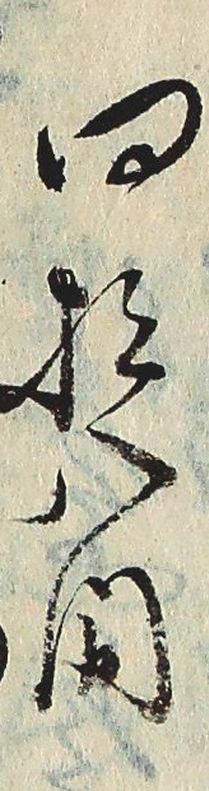同拾八間
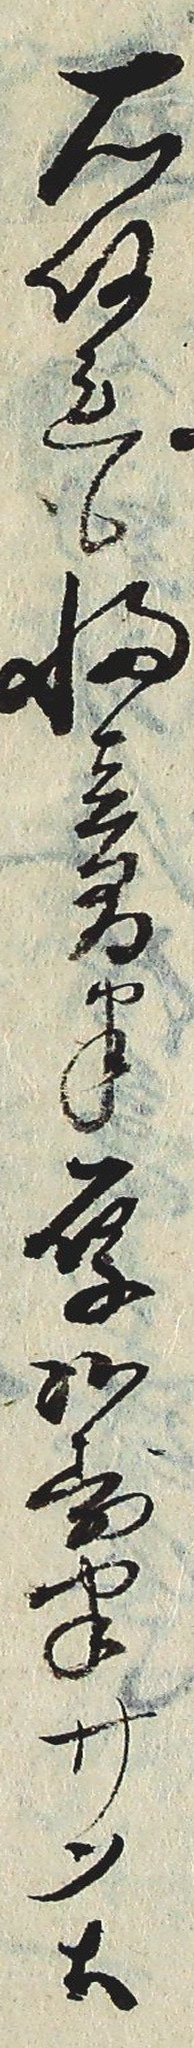右何れも幅壱間半厚弐歩半サメ土
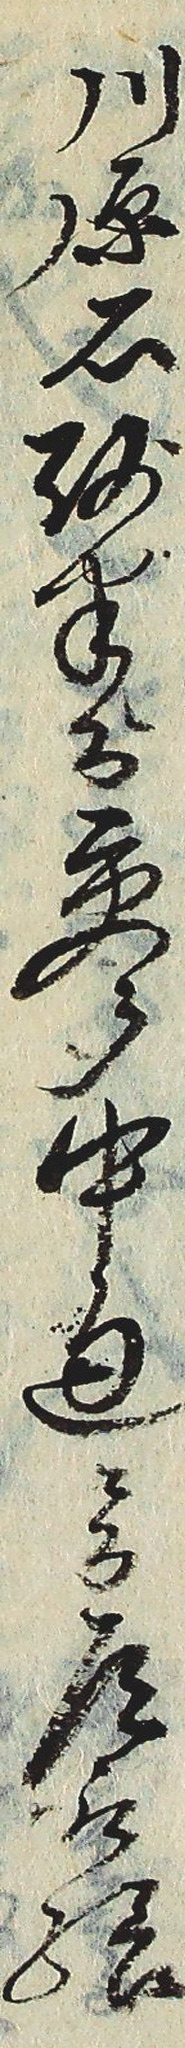川原石砂半分交にして中通にて道取繕
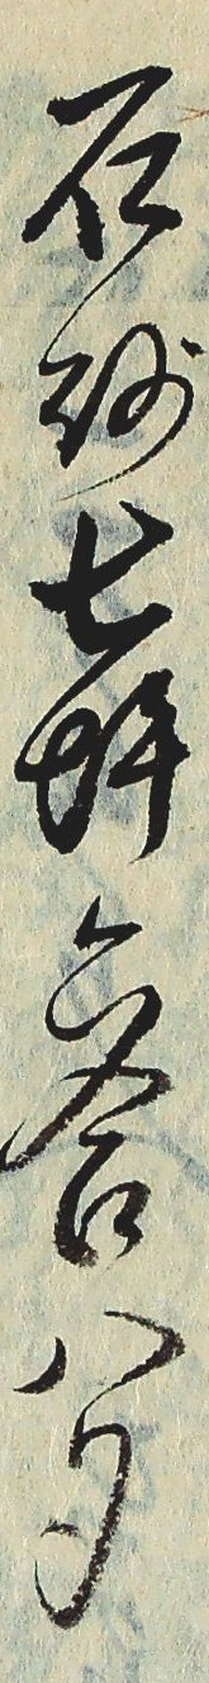石砂七坪六合八勺
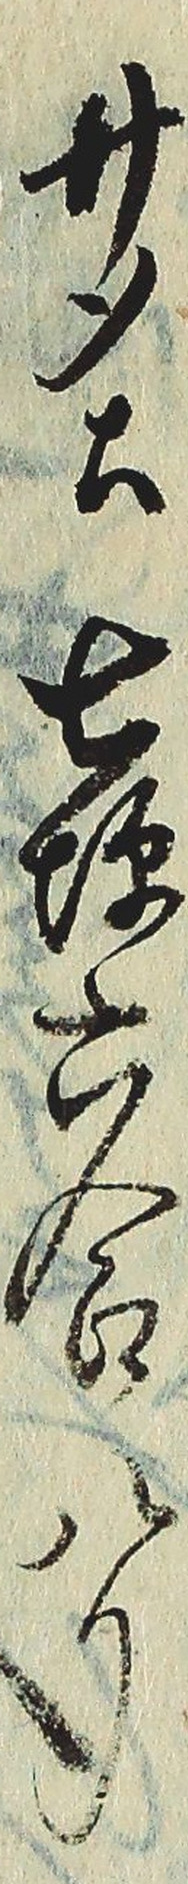石砂七坪六合八勺
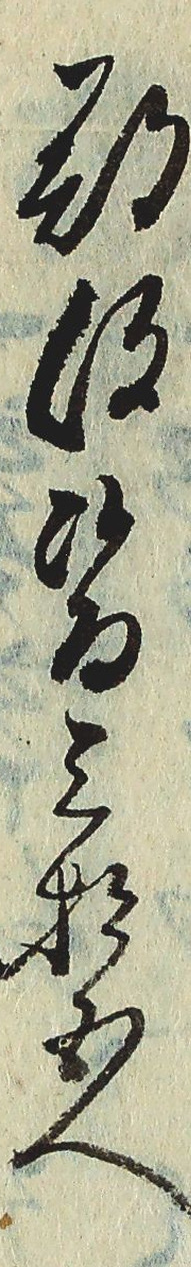郡役弐百三拾五人
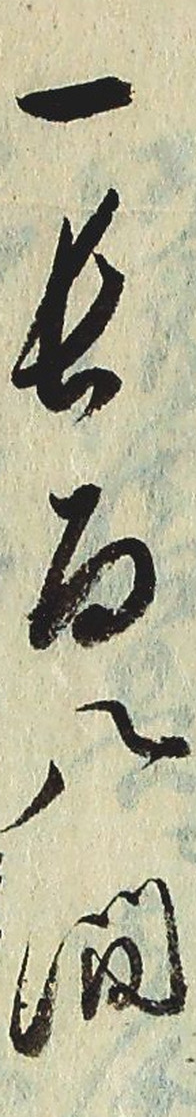一長百八間
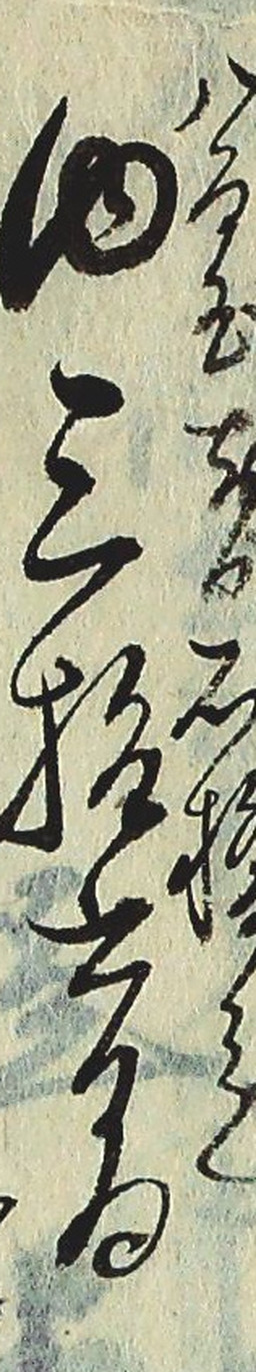同三拾六間
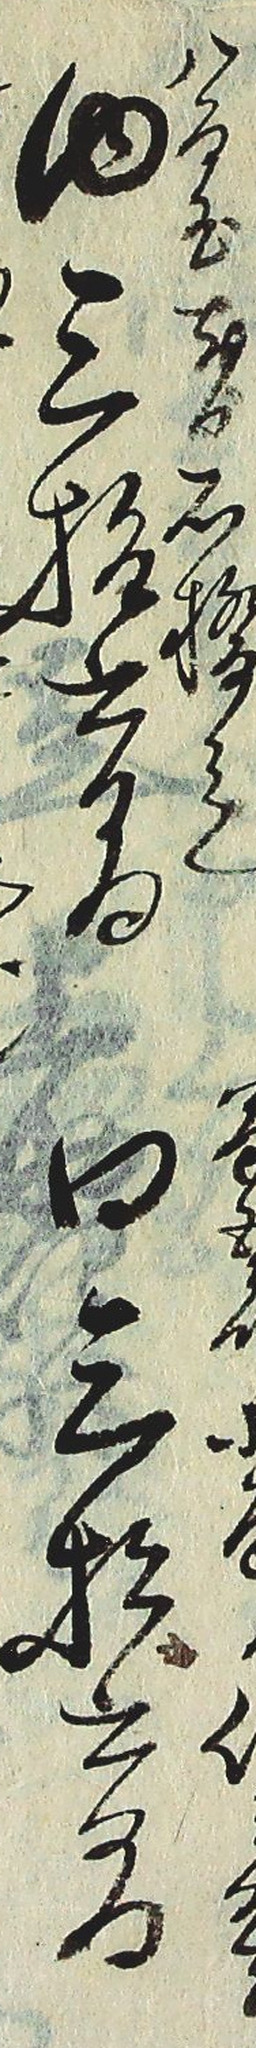内三拾六間同三拾六間
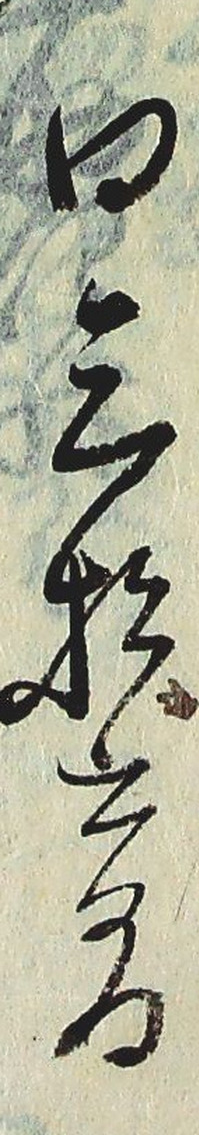同三拾六間
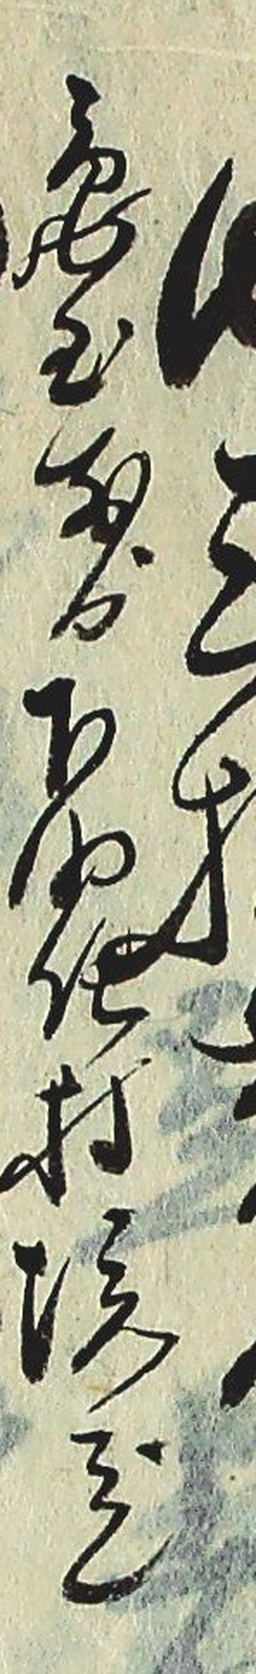亀屋前ゟ下助任村浜迄
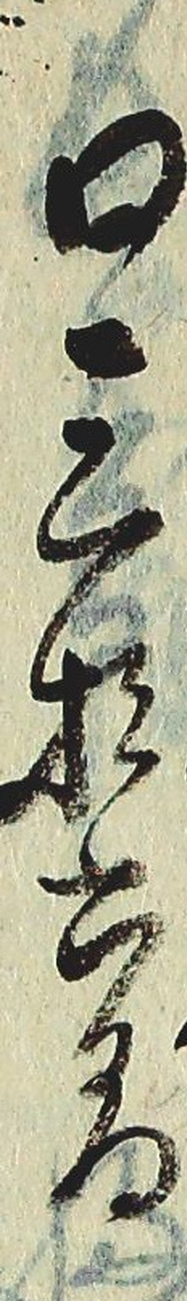同三拾六間
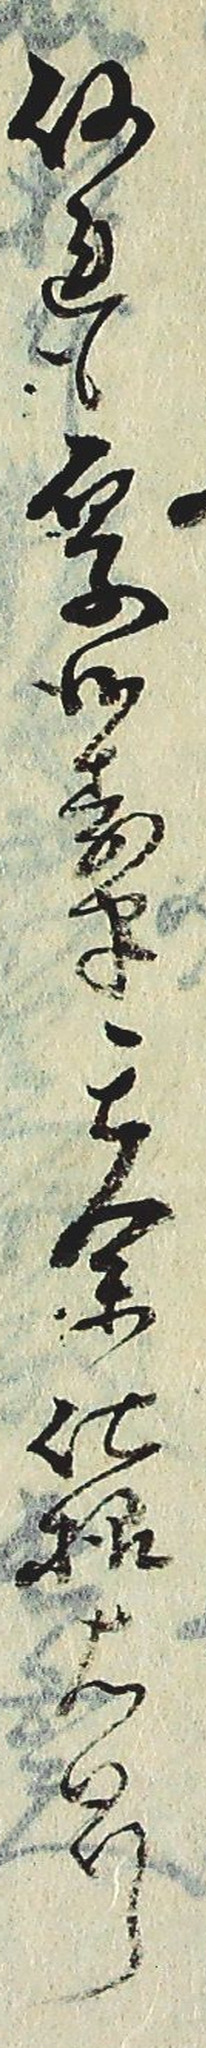何れも厚弐歩半其余仕様右同断
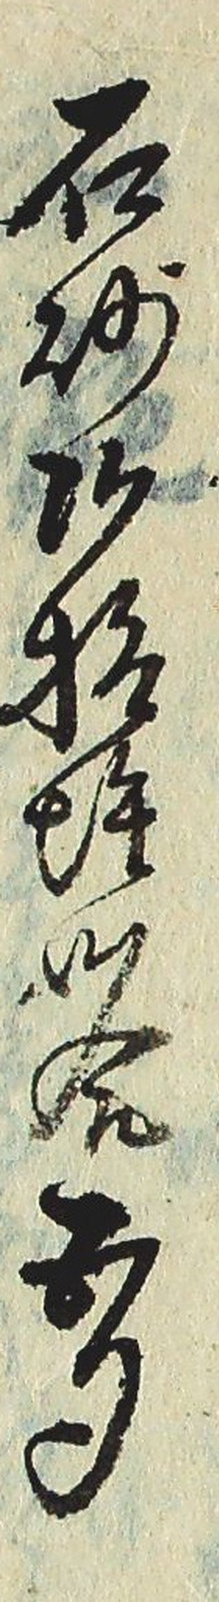石砂弐拾坪弐合五勺
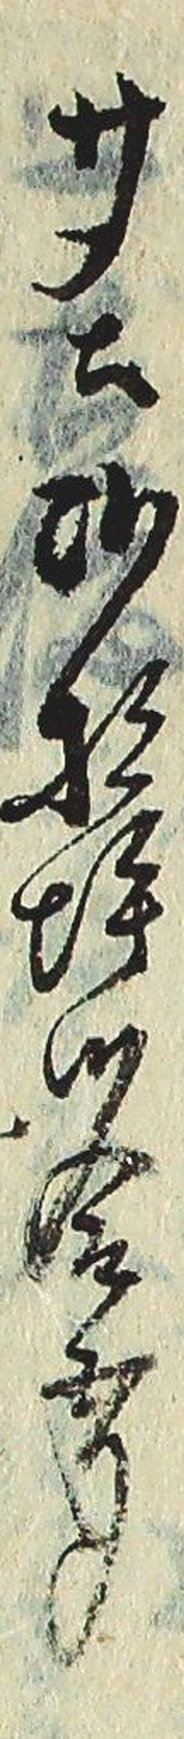サメ土弐拾坪弐合五勺
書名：名東郡中諸割賦元帳
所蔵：鳴門教育大学 Naruto University of Education
